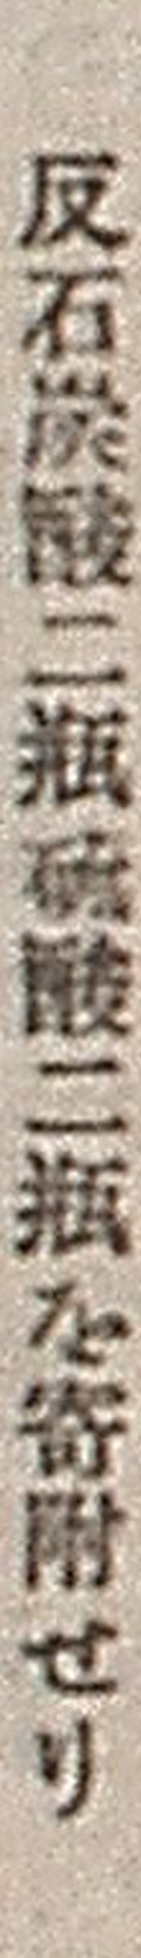反石炭酸ニ瓶硫酸ニ瓶を寄附せり
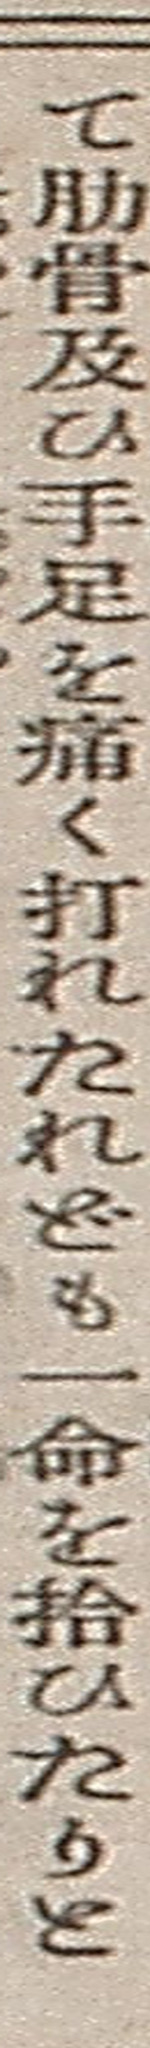て肋骨及ひ手足を痛く打れたれども一命を拾ひたりと
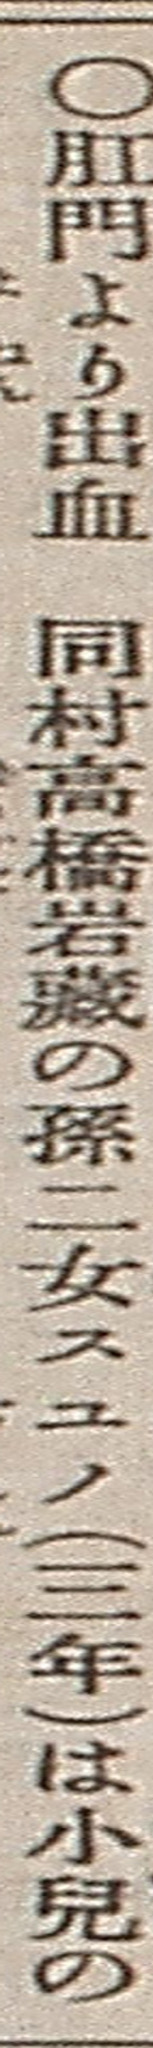〇肛門より出血同村高橋岩蔵の孫ニ女スユノは小児の
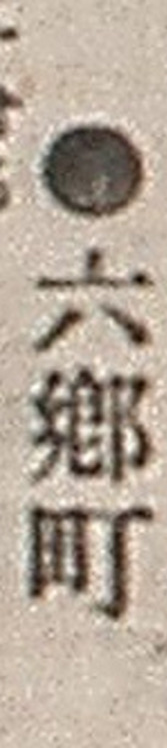●六郷町
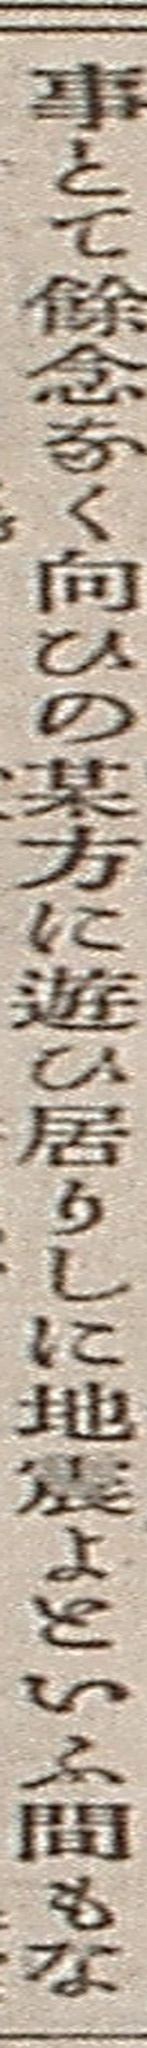事とて余念なく向ひの某方に遊ひ居りしに地震よといふ間もな
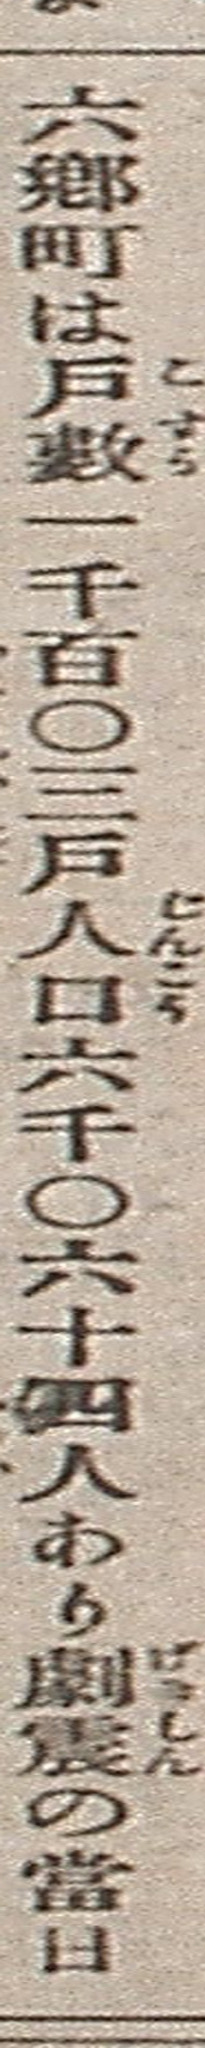六郷町は戸数一千百〇三戸人口六千〇六十四人あり劇震の当日
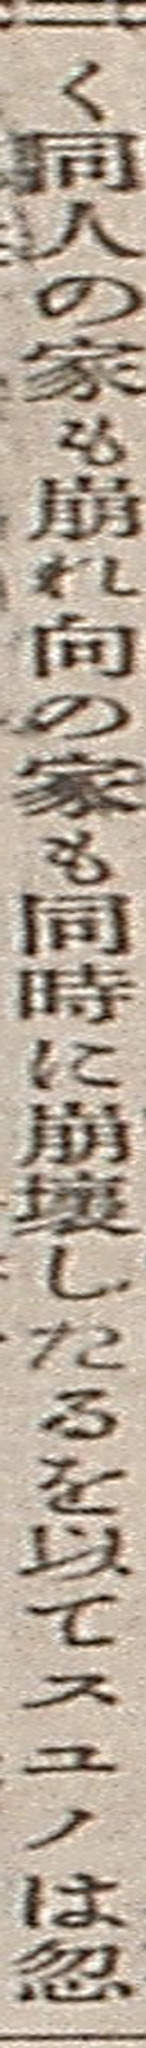く同人の家も崩れ向の家も同時に崩壊したるを以てスユノは忽
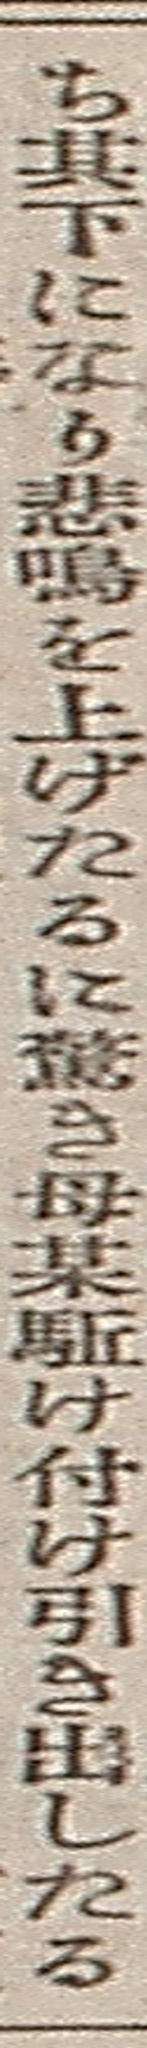ち其下になり悲鳴を上げたるに驚き母某駈け付け引き出したる
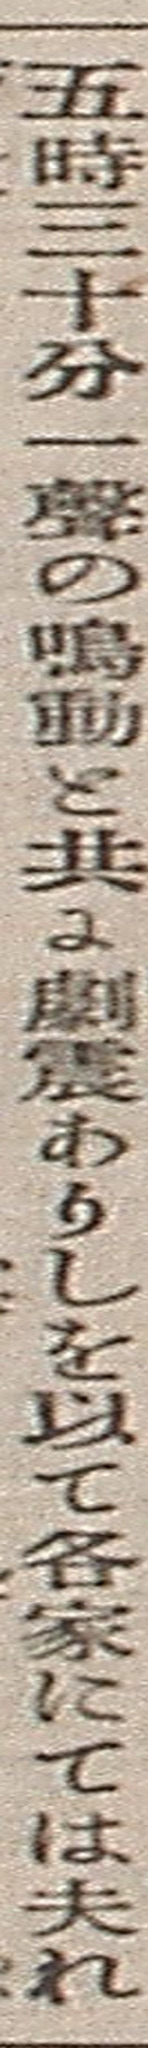五時三十分一声の鳴動と共に劇震ありしを以て各家にては夫れ
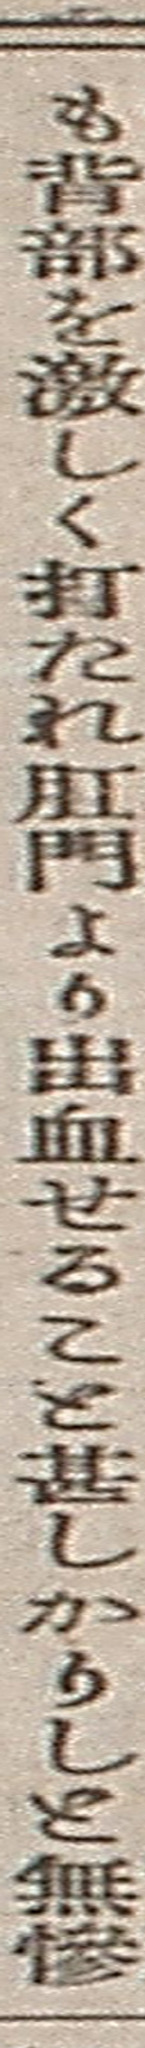も背部を激しく打たれ肛門より出血せること甚しかりしと無惨
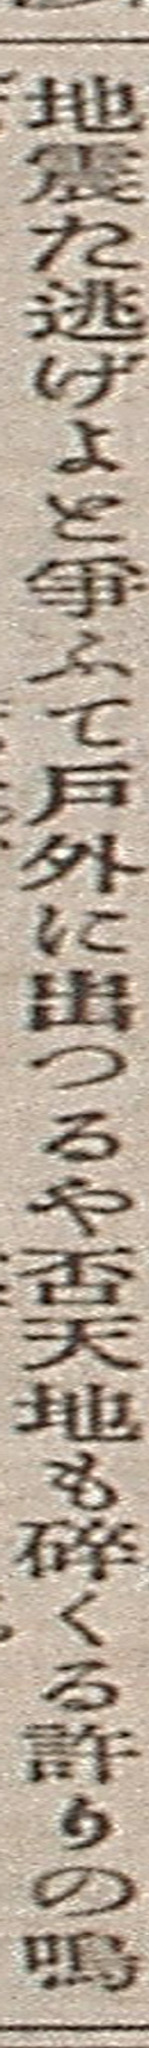地震た逃げよと争ふて戸外に出つるや否天地も砕くる許りの鳴
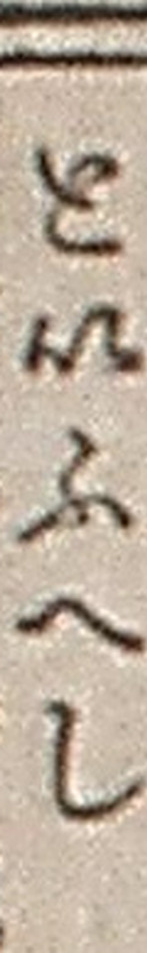といふへし
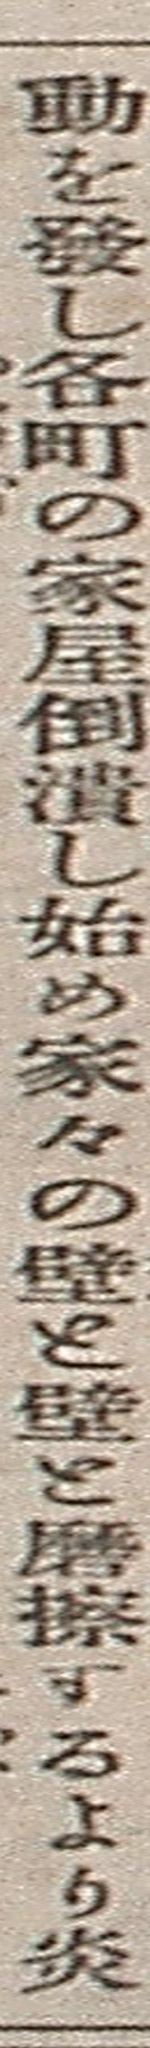動を発し各町の家屋倒潰し始め家々の壁と壁と摩擦するより炎
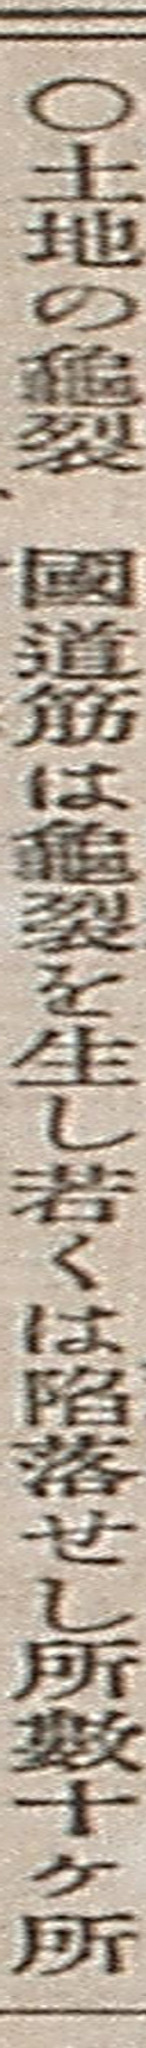〇土地の亀裂国道筋は亀裂を生し若くは陥落せし所数十ケ所
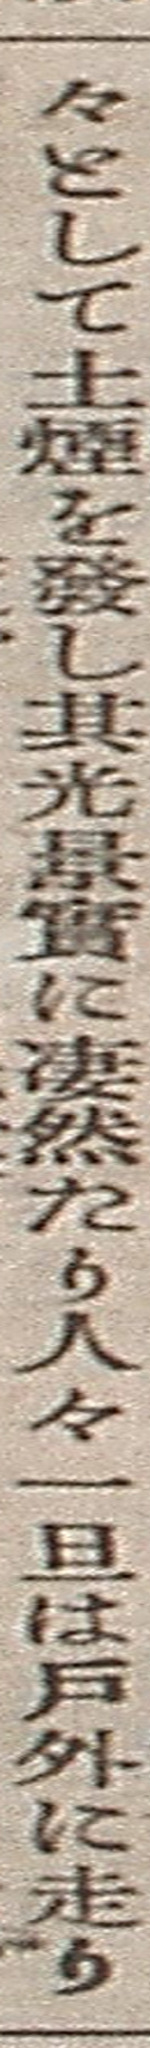々として土煙を発し其光景実に凄然たり人々一旦は戸外に走り
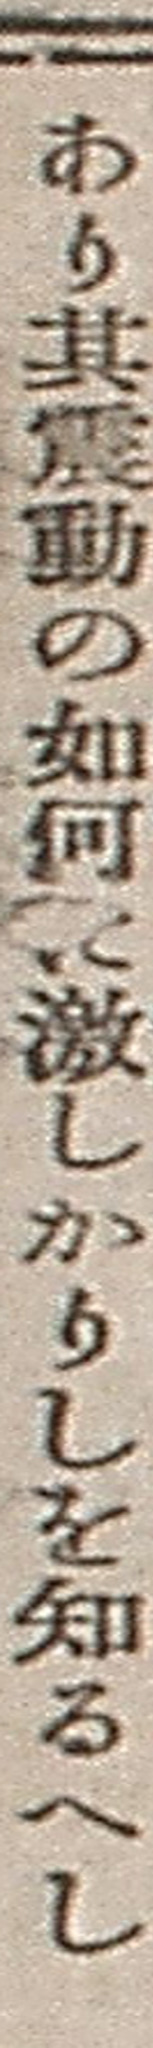あり其震動の如何に激しかりしを知るへし
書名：風俗畫報臨時増刊第百二十四號　洪水地震被害録（上）
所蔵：東京大学地震研究所図書室 Earthquake Research Institute Library, The University of Tokyo, JAPAN
